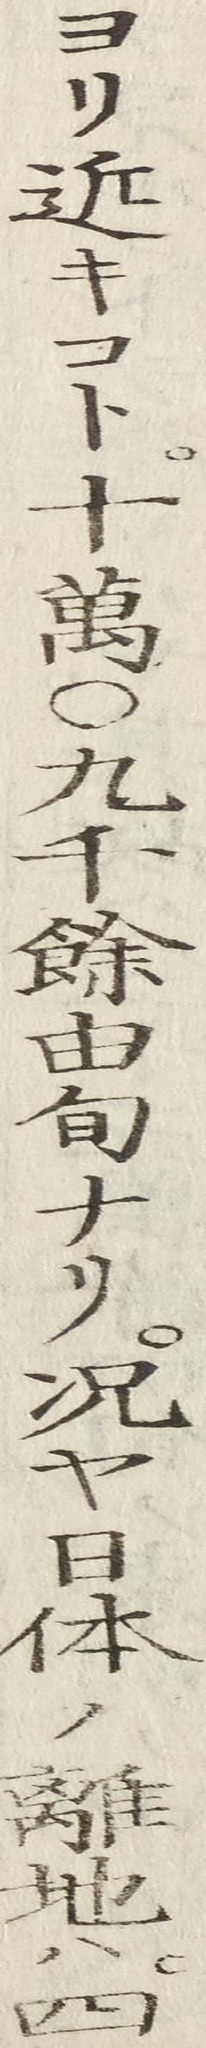ヨリ近キコト。十万〇九千余旬ナリ。况ヤ日体ノ離地ハ。四
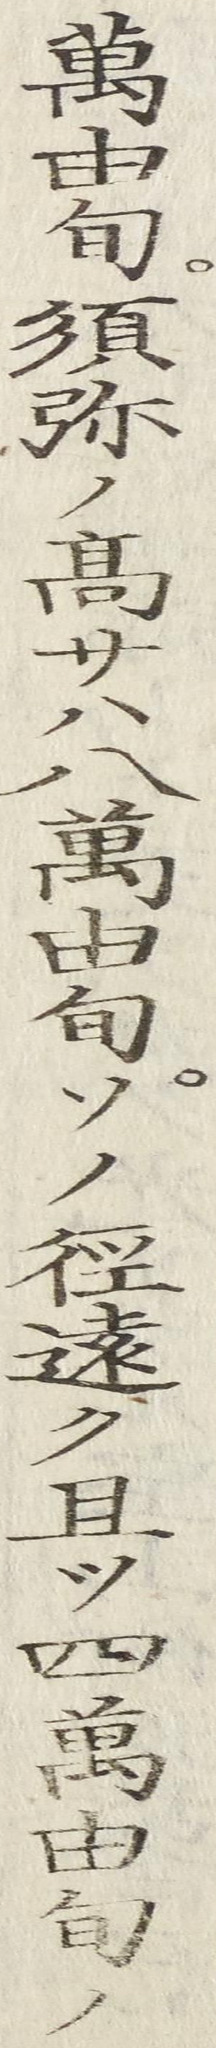万由旬。須弥ノ高サハ八万由旬。ソノ径遠ク且ツ四万由旬ノ
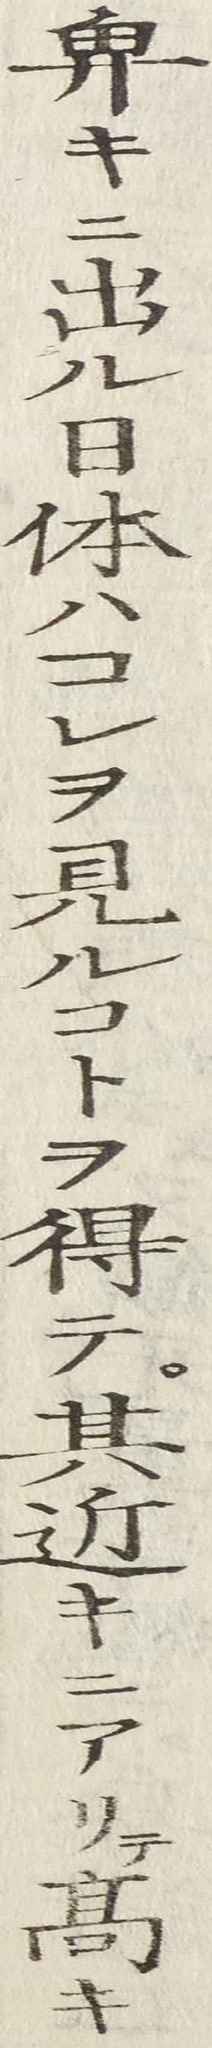卑キニ出ル日体ハコレヲ見ルコトヲ得テ。其近ミニアリテ高キ
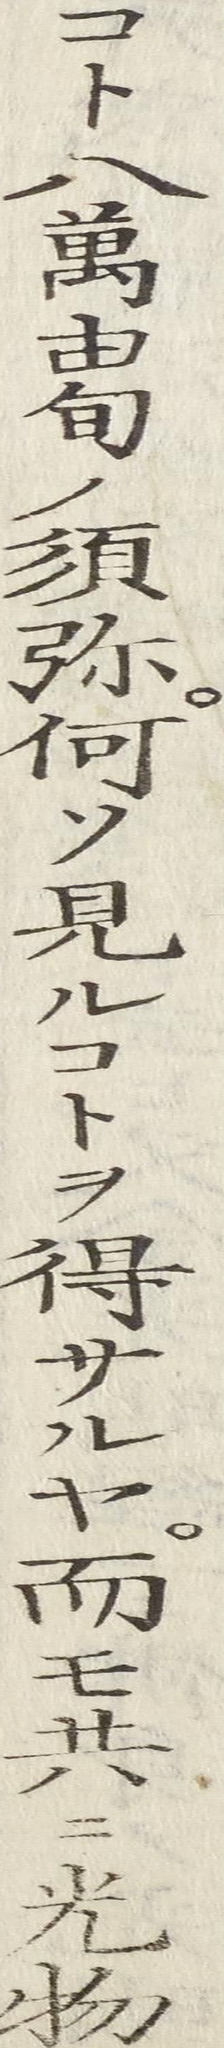コト八万由旬ノ須弥。何ソ見ルコトヲ得サルヤ。而モ共ニ光物
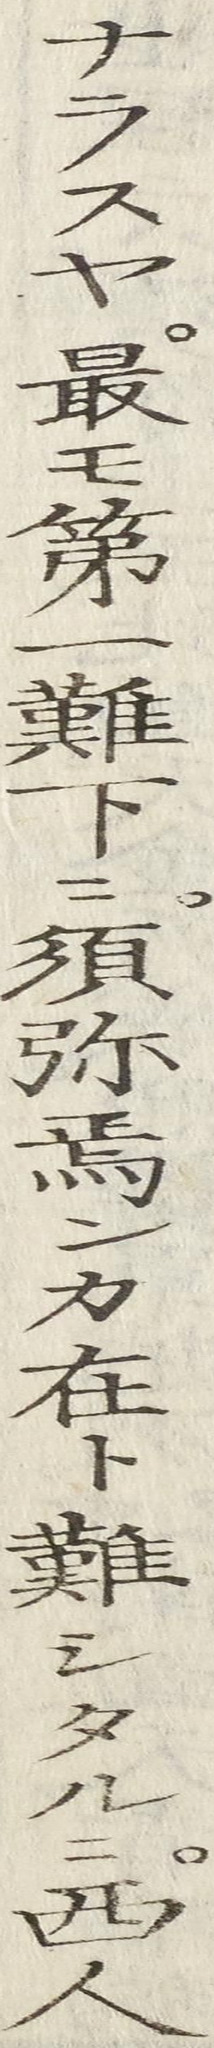ナラスヤ。最モ第一難下ニ。須弥焉ンカ在ト難シタルニ。西人
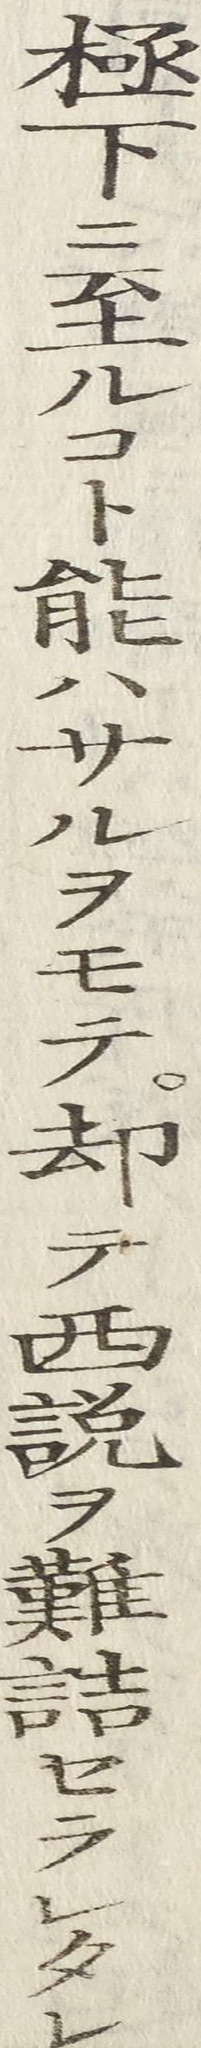極下ニ至ルコト能ハサルヲモテ。却テ西説ヲ難詰セラレタレ
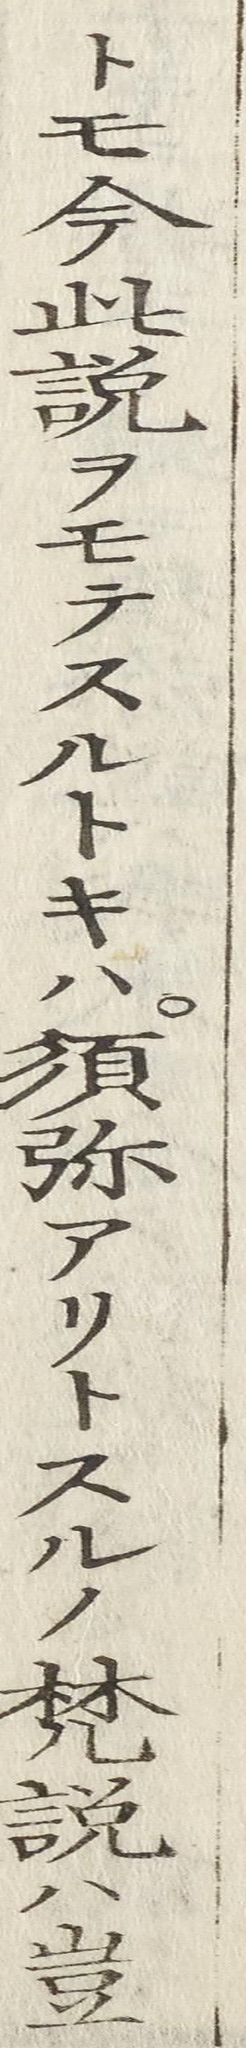トモ今此説ヲモテスルトキハ。須弥アリトスルノ梵説ハ豈
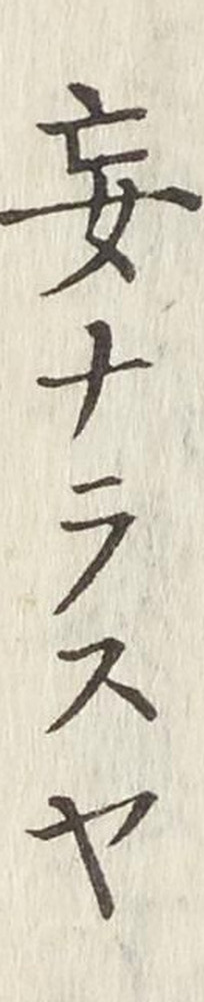妄ナラスヤ
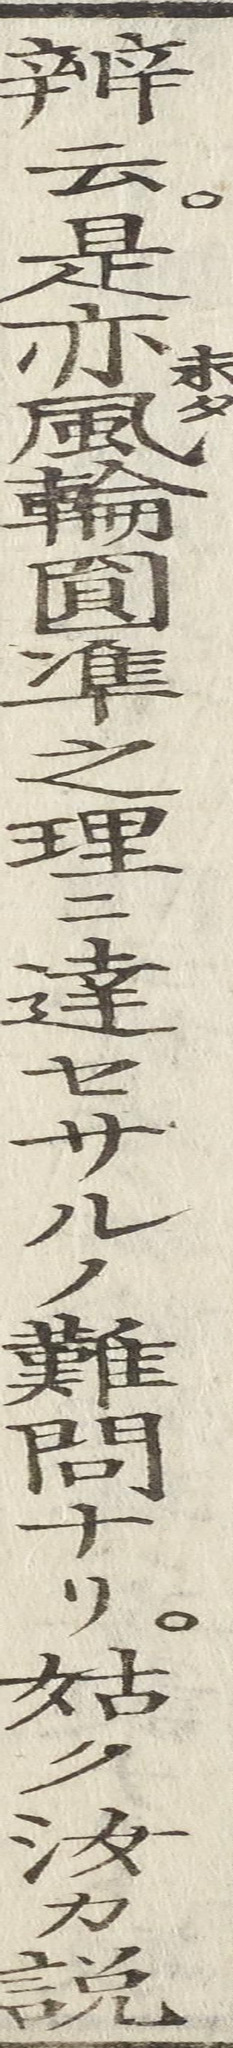弁云。是亦未タ風輪円準之理ニ達セサルノ難問ナリ。姑ク汝カ説
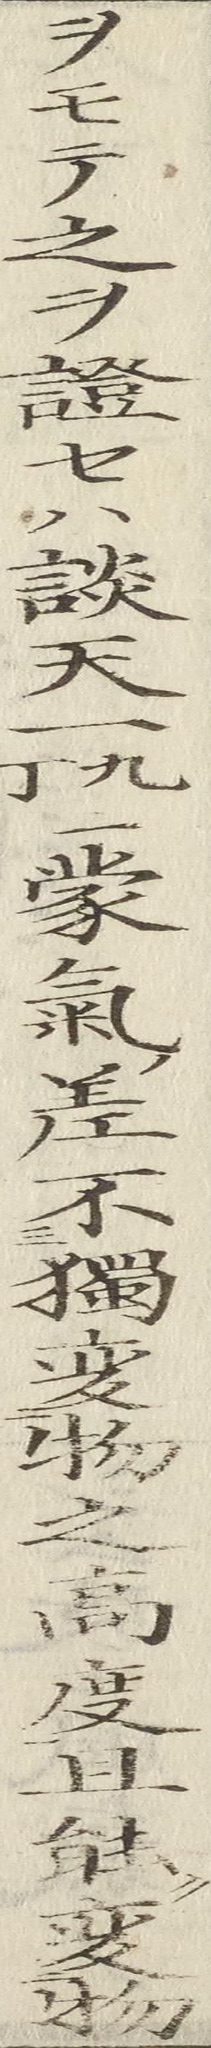ヲモテ之ヲ証セハ談天一九丁ニ豪気差不独変ニ物之高度且能変ニ物
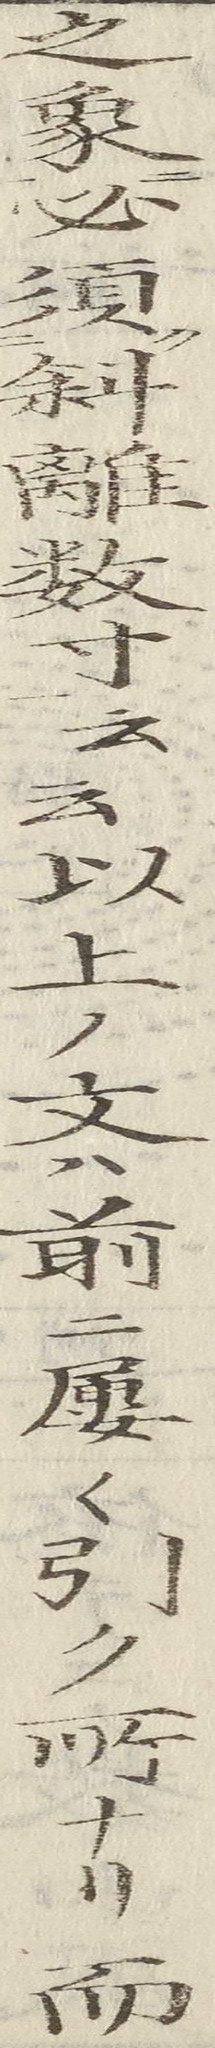之象必須ニ斜離数寸云云以上ノ文ハ前ニ屡〱引ク所ナリ而
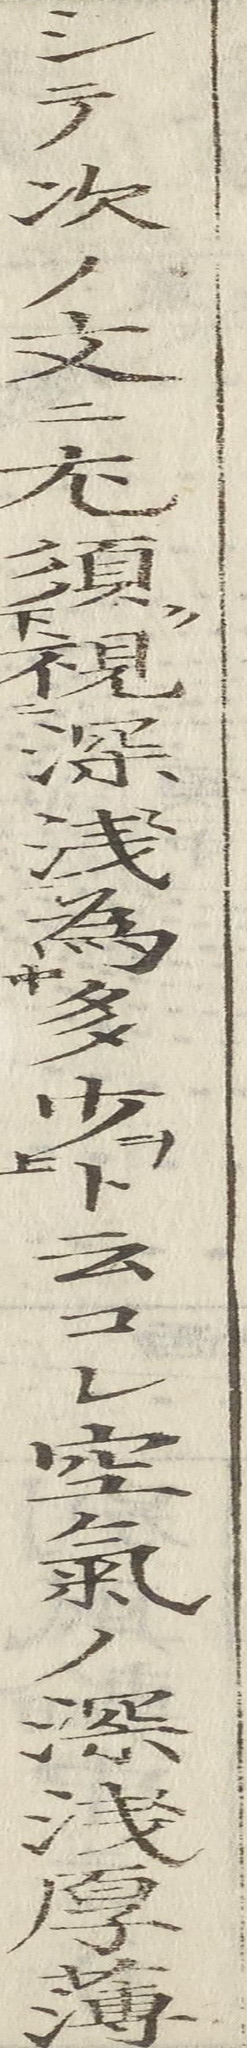シテ次ノ文ニ尤須視ニ深浅為多少云コレ空気ノ深浅厚薄
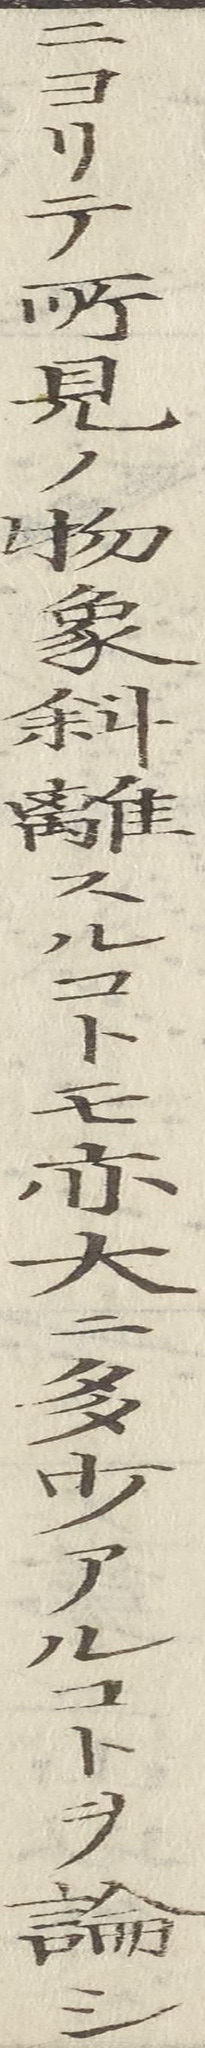ニヨリテ所見ノ物象斜離スルコトモ亦大ニ多少アルコトヲ論シ
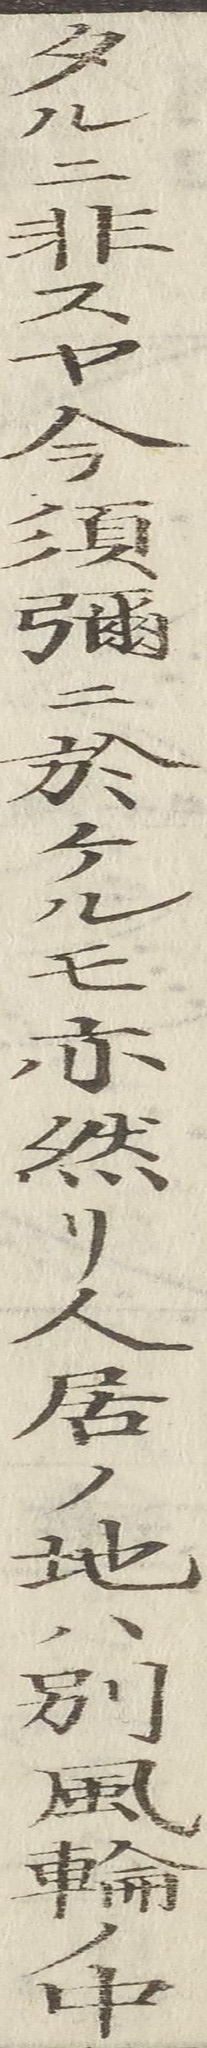タルニ非スヤ今須弥ニ於ケルモ亦然リ人居ノ地ハ別風輪ノ中
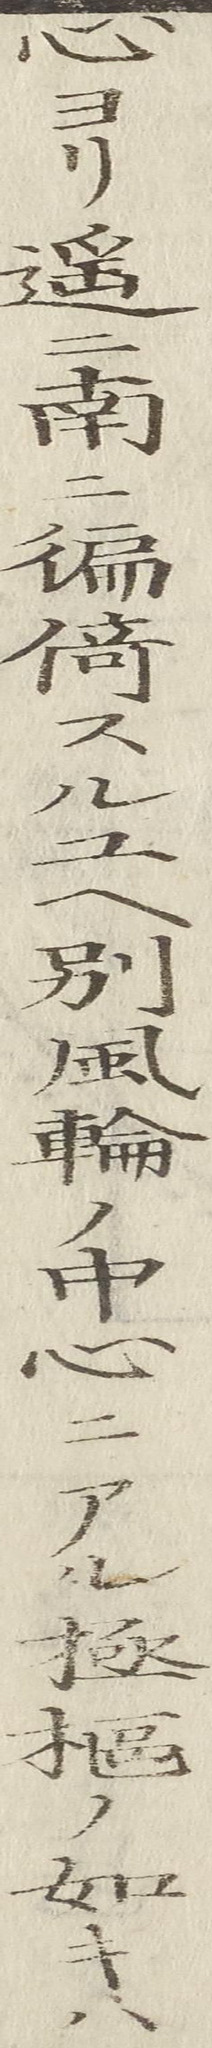心ヨリ遥ニ南ニ偏倚スルユヘ別風輪ノ中心ニアル極枢ノ如キハ
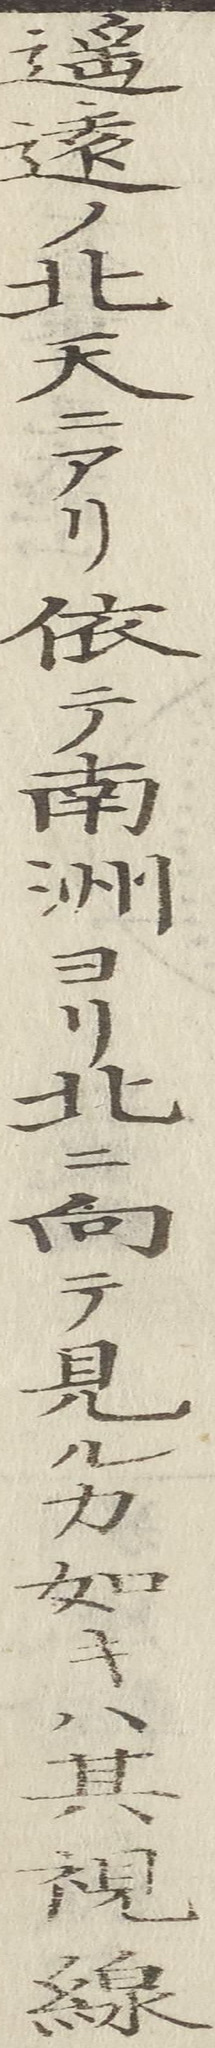遥遠ノ北天ニアリ依テ南洲ヨリ北ニ向テ見ルカ如キハ其視線
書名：護法新論　二編　中
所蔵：東京大学地震研究所図書室 Earthquake Research Institute Library, The University of Tokyo, JAPAN
